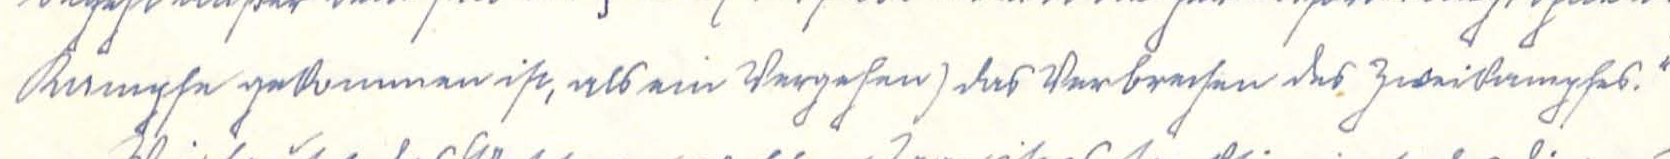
Kampfe gekommen ist, als ein Vergehen) das Verbrechen des Zweikampfes."
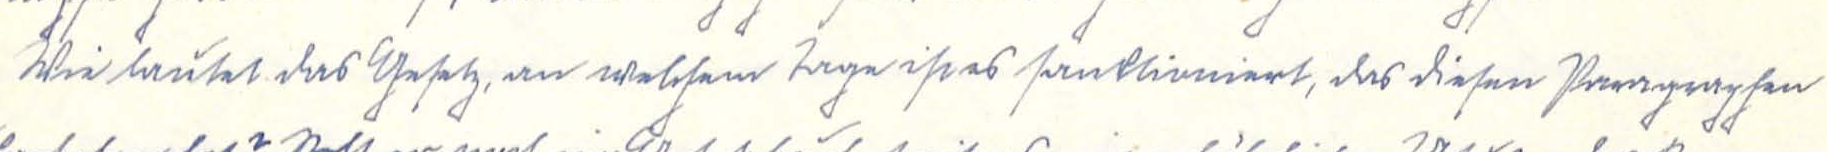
Wie lautet das Gesetz, an welchem Tage ist es sanktioniert, das diesen Paragraphen
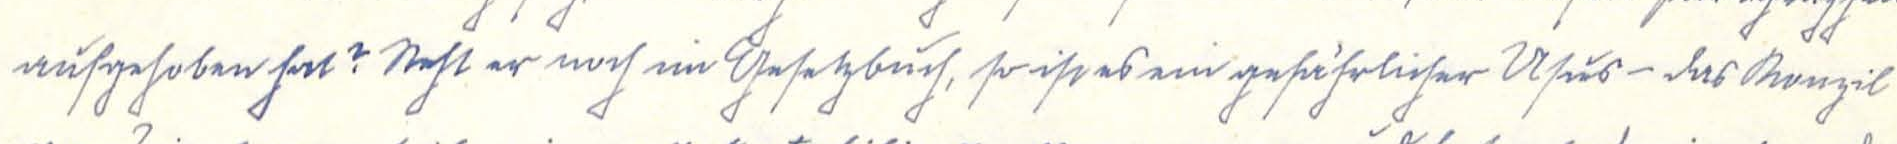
aufgehoben hat? Steht er noch im Gesetzbuch, so ist es ein gefährlicher Usus - das Konzil
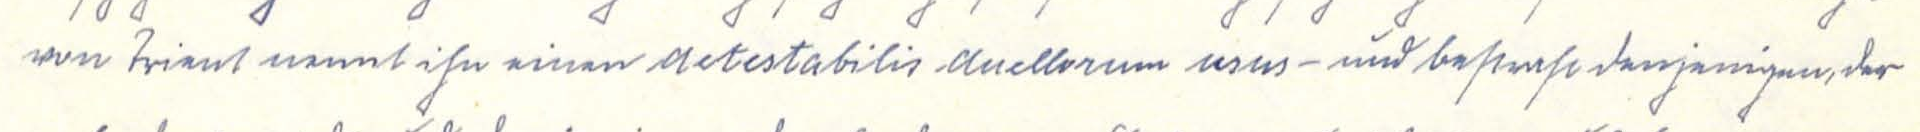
von Trient nennt ihn einen detestabilis duellorum usus - und bestraft denjenigen, der
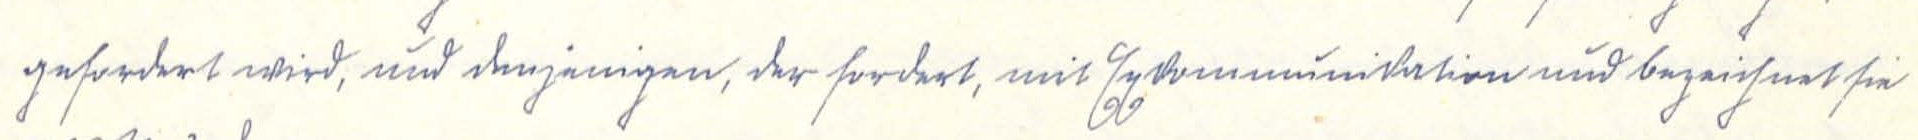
gefordert wird, und denjenigen, der fordert, mit Exkommunikation und bezeichnet sie
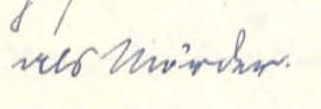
als Mörder.
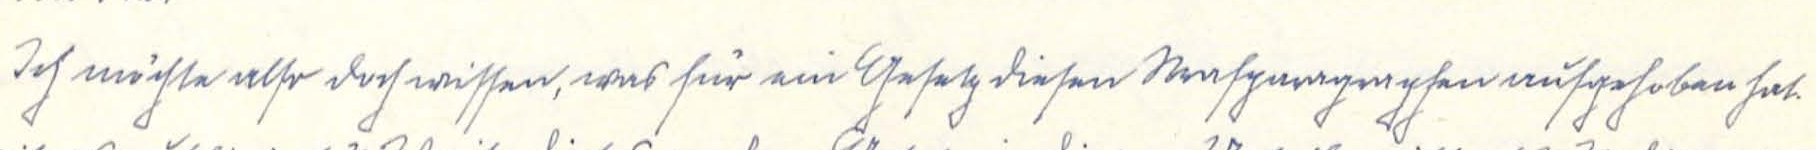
Ich möchte also doch wissen, was für ein Gesetz diesen Strafparagraphen aufgehoben hat.
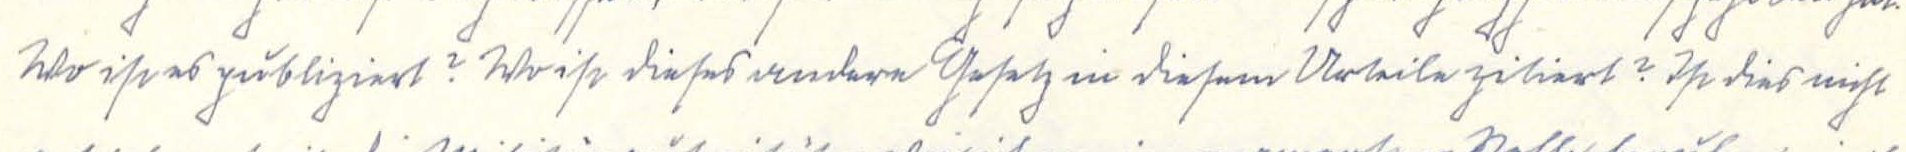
Wo ist es publiziert? Wo ist dieses andere Gesetz in diesem Urteile zitiert? Ist dies nicht
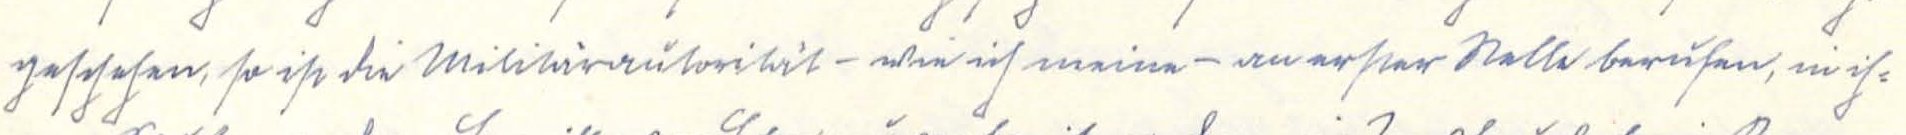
geschehen, so ist die Militärautorität - wie ich meine - an erster Stelle berufen, in ih-
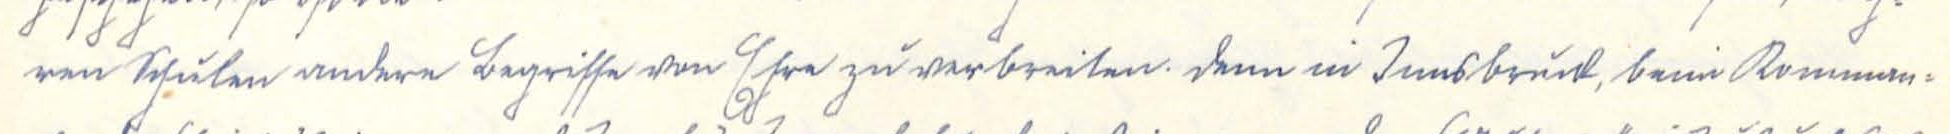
ren Schulen andere Begriffe von Ehre zu verbreiten. Denn in Innsbruck, beim Komman-
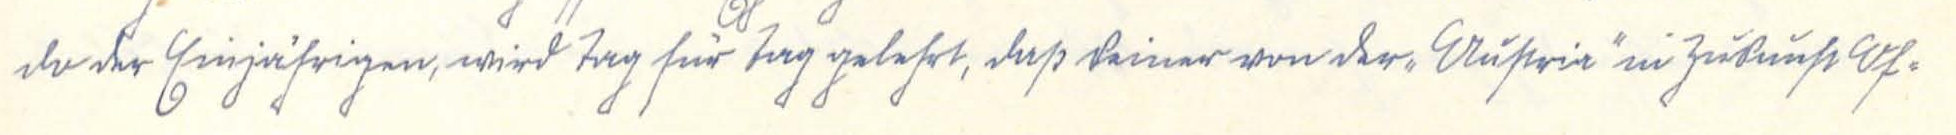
do der Einjährigen, wird Tag für Tag gelehrt, daß keiner von der „Austria“ in Zukunft Of-
